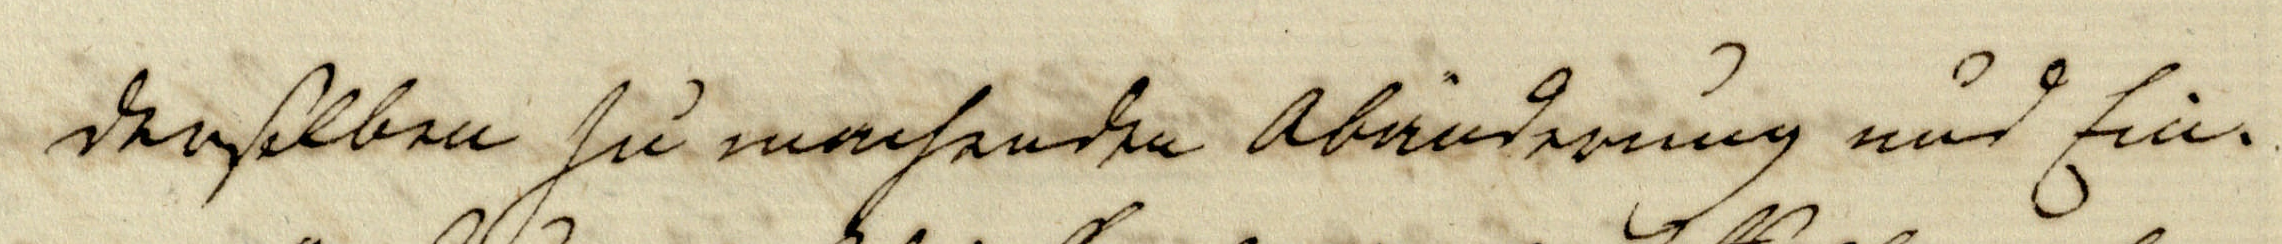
derselben zu machenden Abänderung und Ein¬
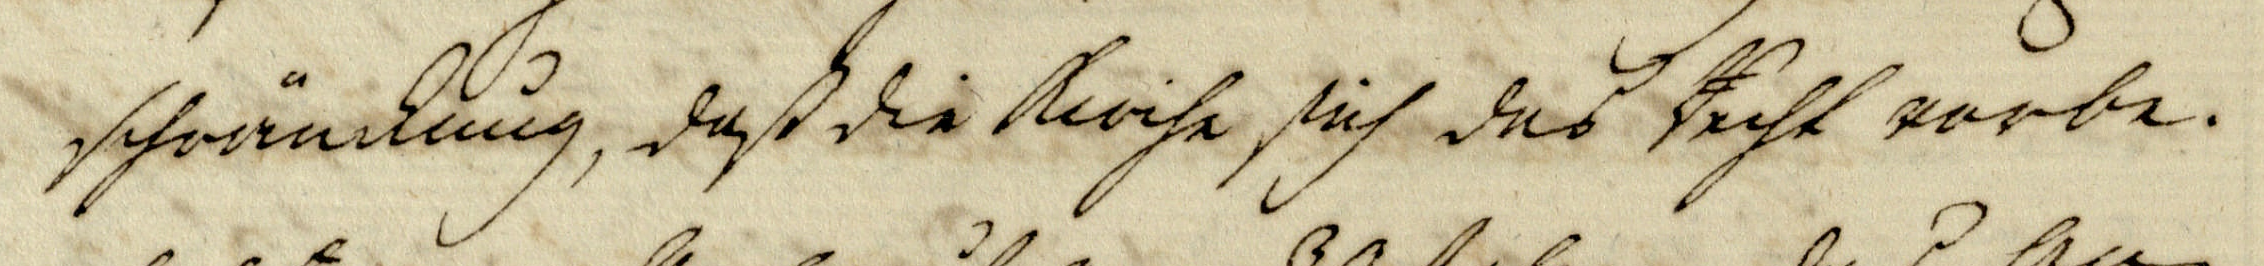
schränckung, daß die Kirche sich des Recht vorbe¬
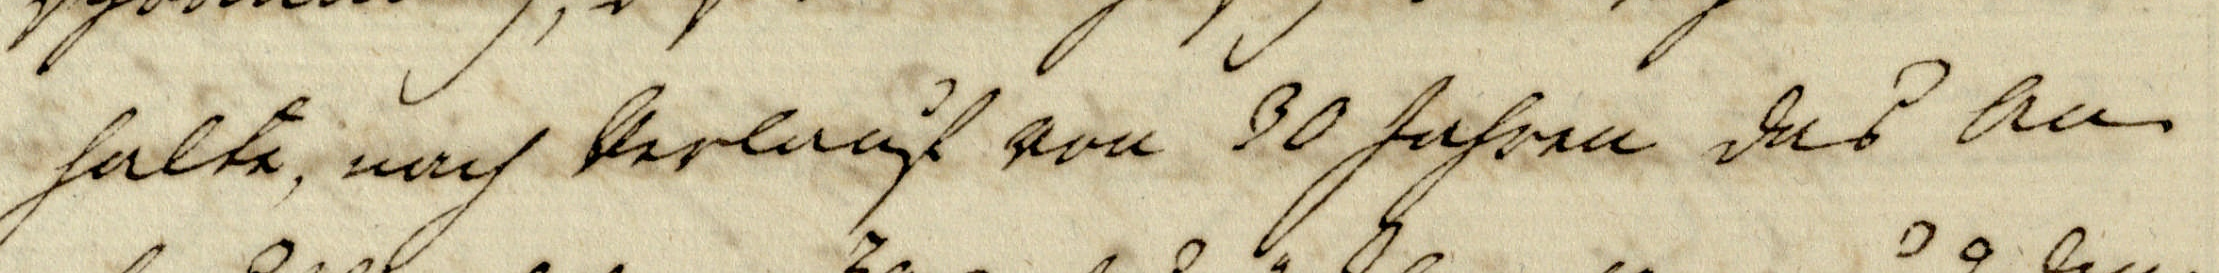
halte, nach Verlauf von 30 Jahren das An¬
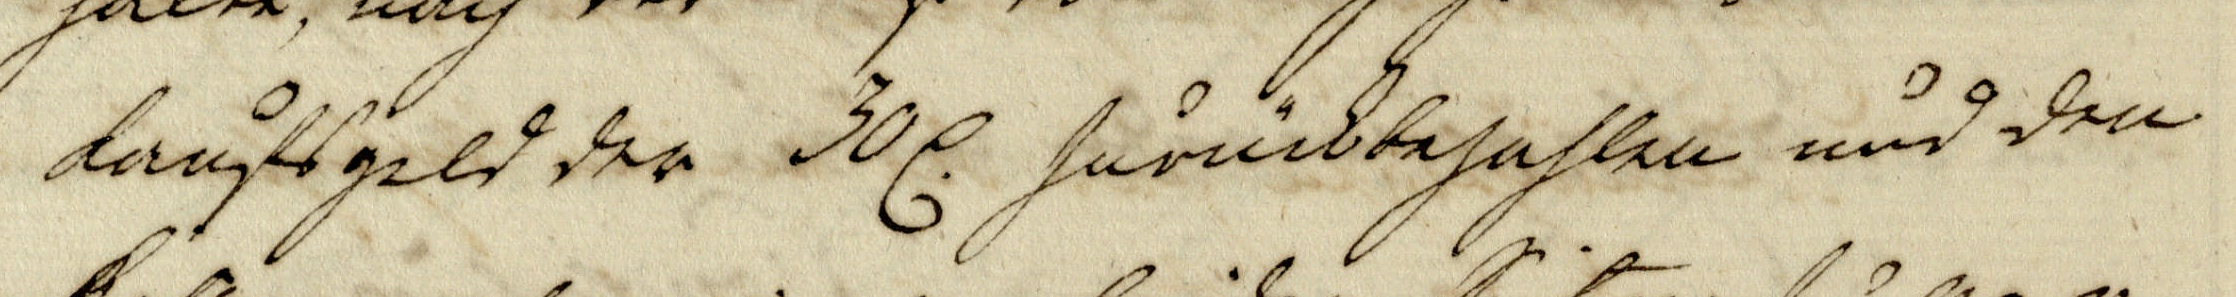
kaufsgeld der 30 l. zurückbezahlen und den
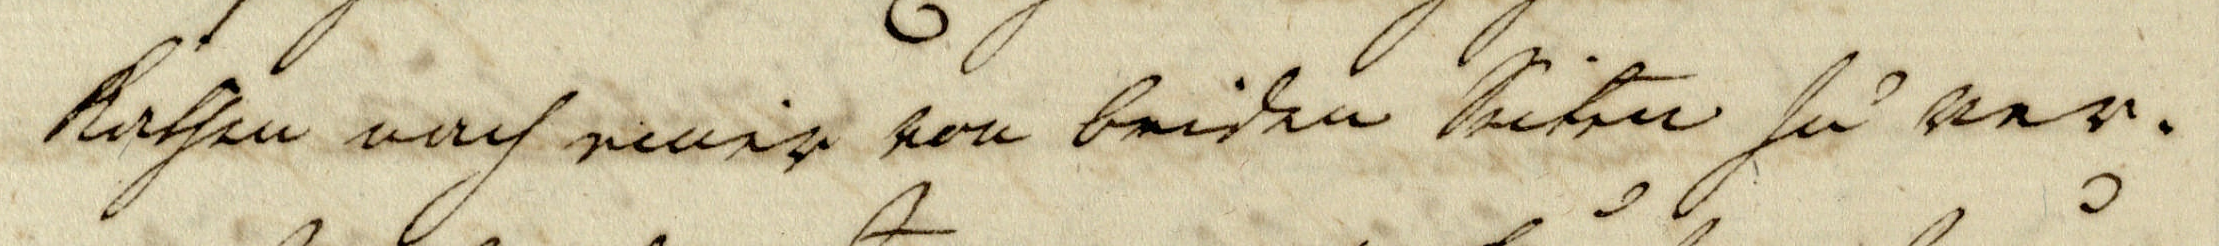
Kathen nach einer von beiden Seiten zu ver¬
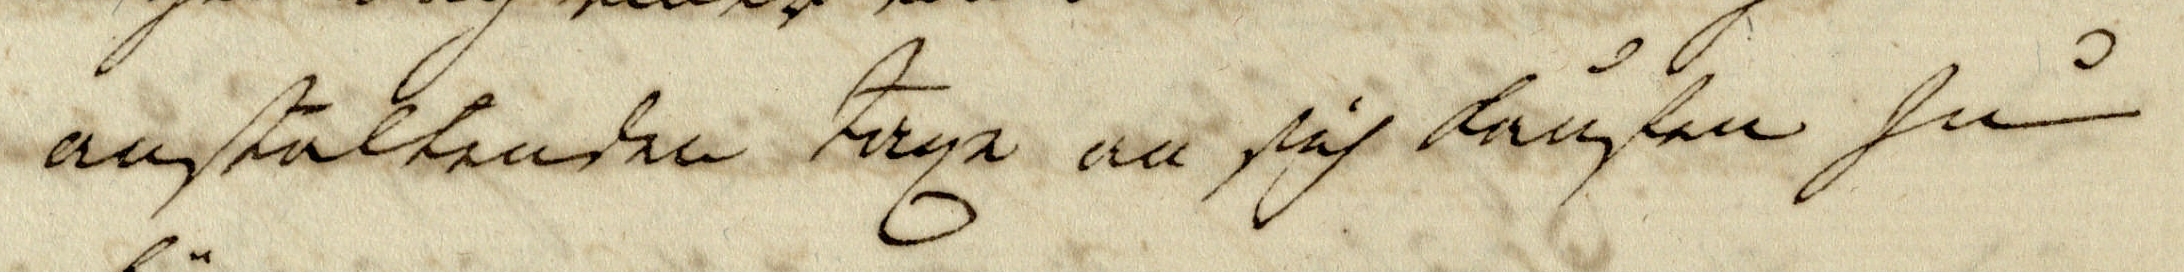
anstaltenden Taxe an sich kaufen zu
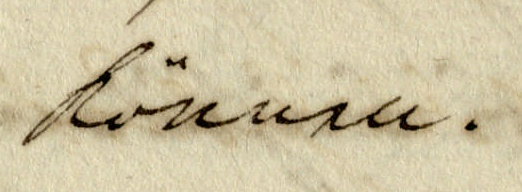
können.
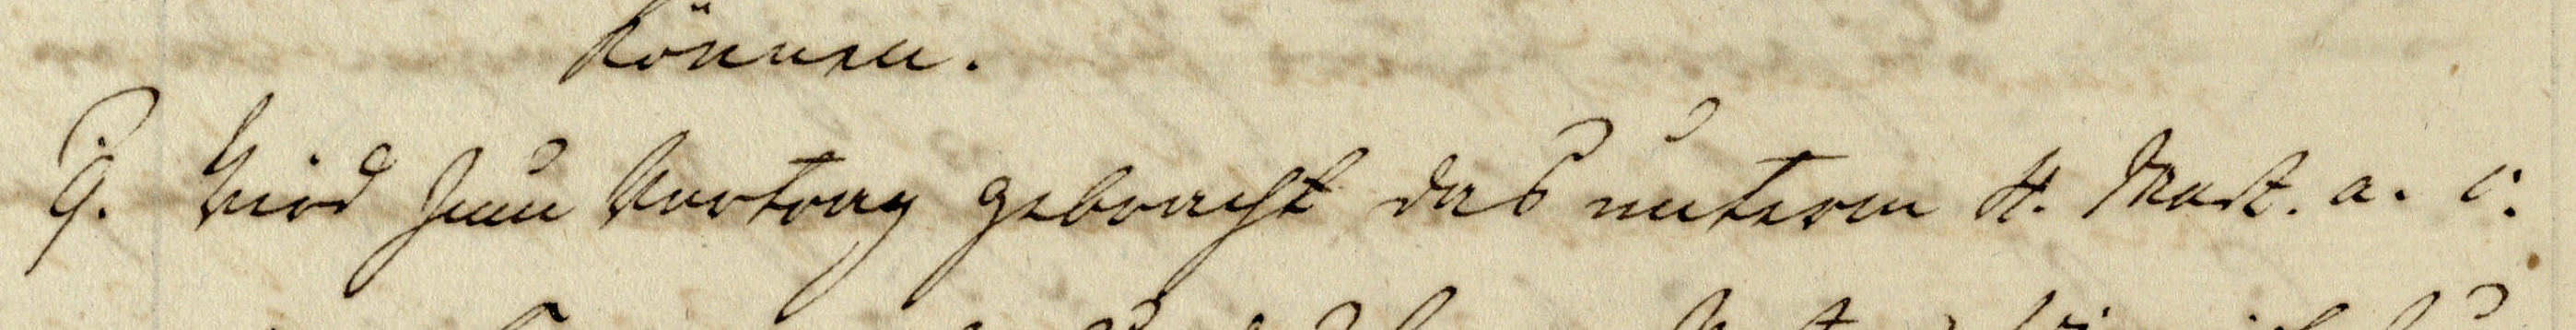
9. Wird zum Vortrag gebracht das unterm 4. Mart a. c.
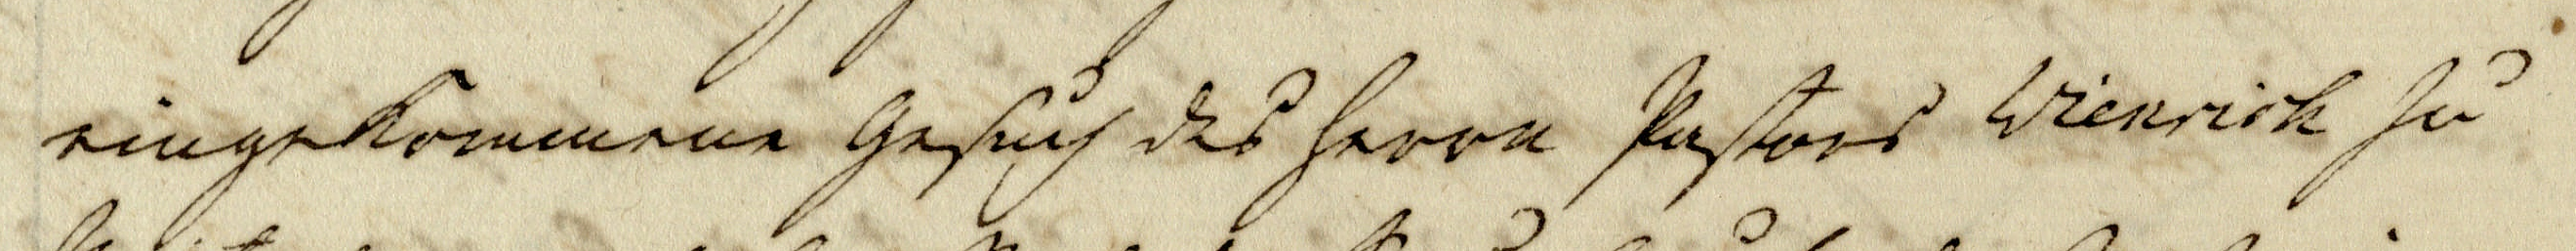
eingekommene Gesuch des Herrn Pastors Wienrich zu
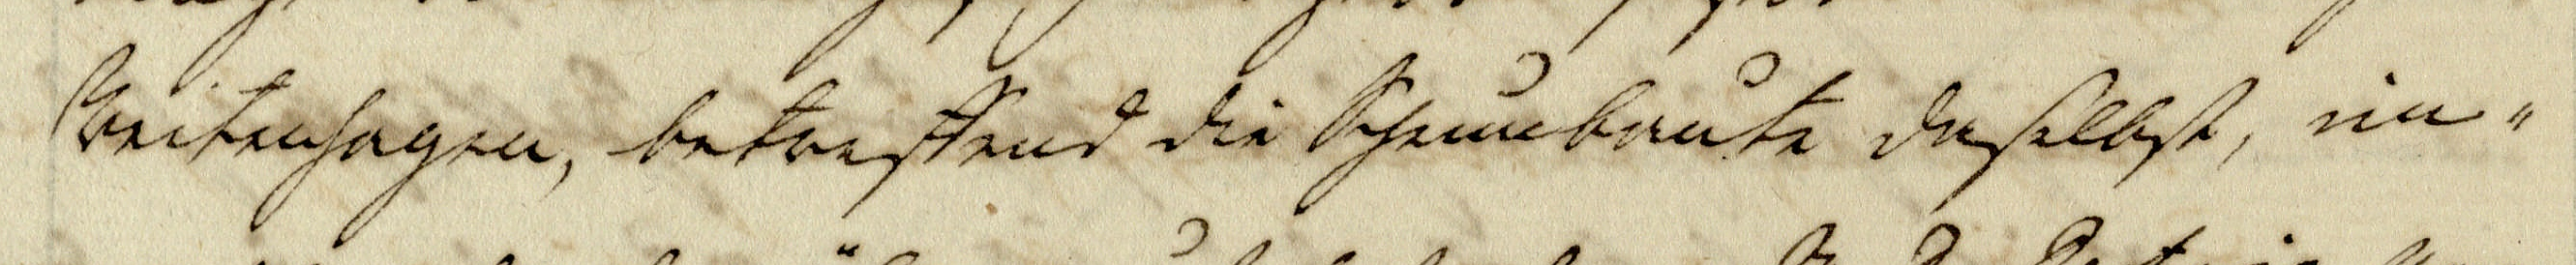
Weitenhagen, betreffend die Scheunbaute daselbst, im¬
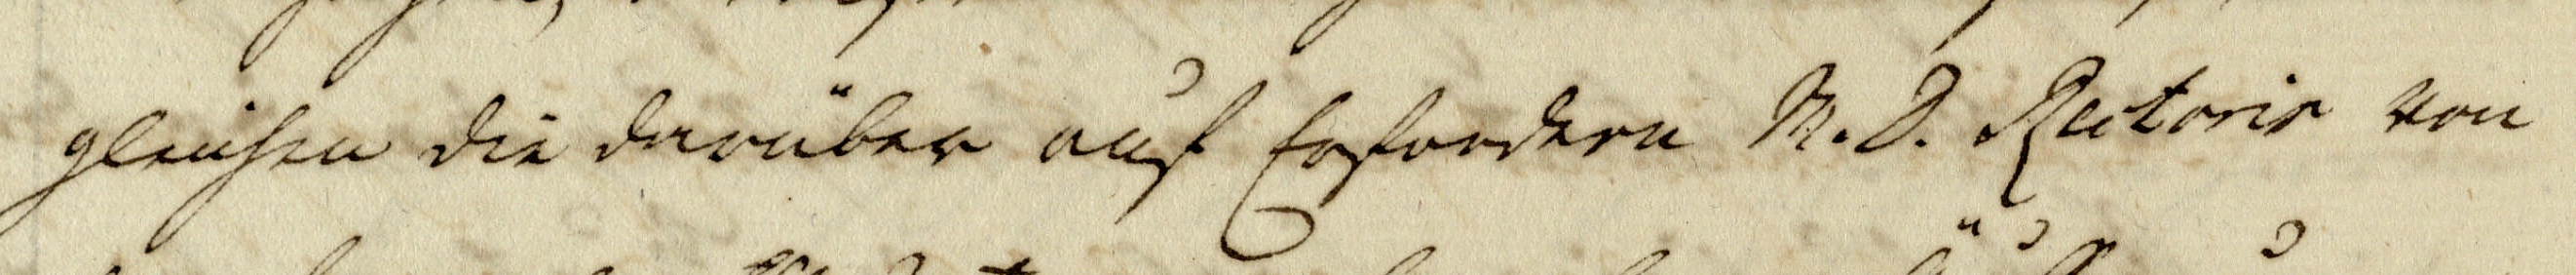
gleichen die darüber auf Erfordern M. D. Rectoris von
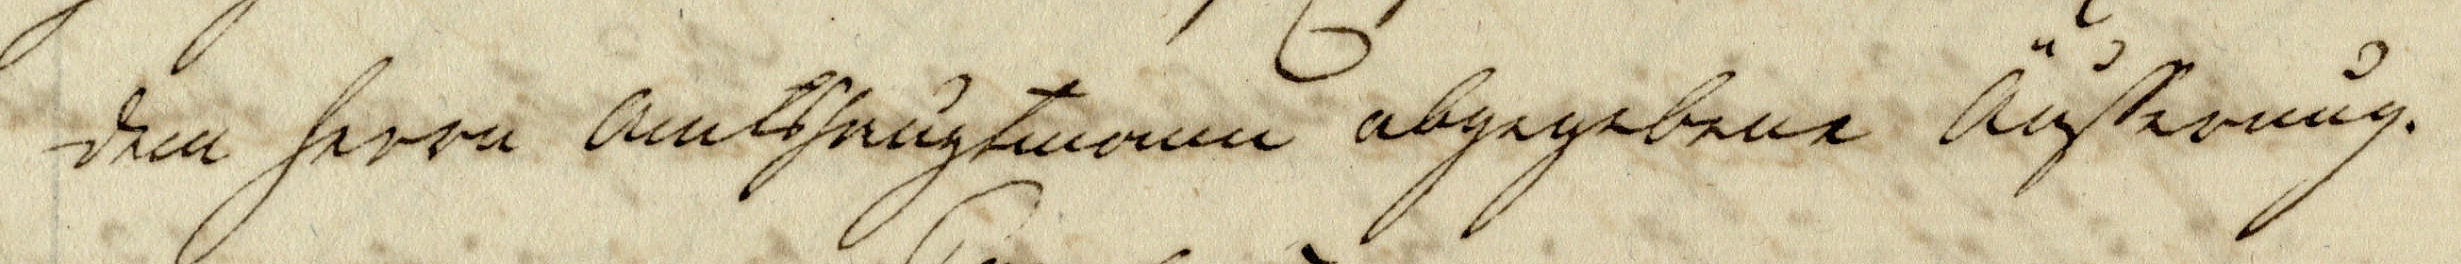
dem Herrn Amtshauptmann abgegebene Äusserung.
